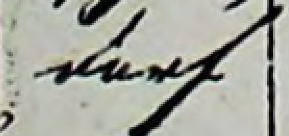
dorf
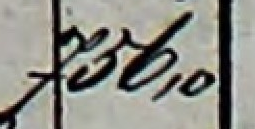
756,0
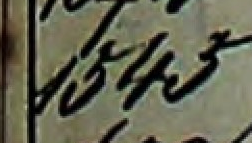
1545
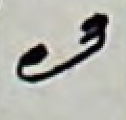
3
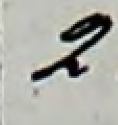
2
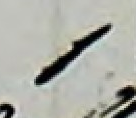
1
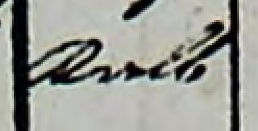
Kalb
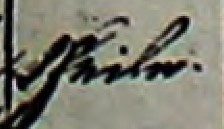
Sheile.
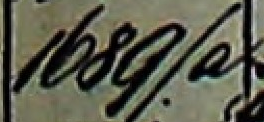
1689/a
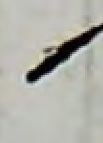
1
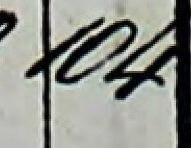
104
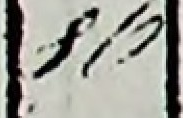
86
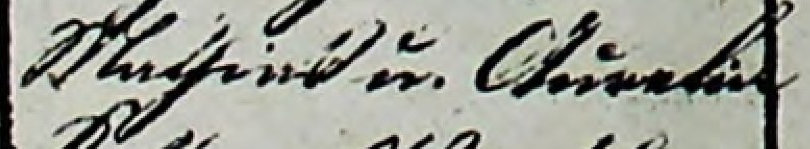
Mathias u. Aurelin
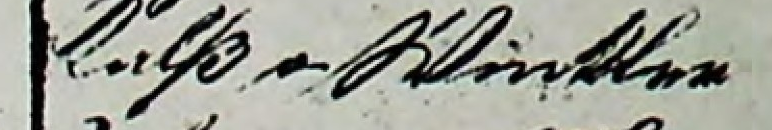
Karlß v. Winkler
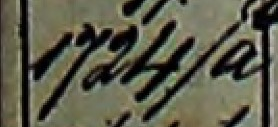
1724/a
